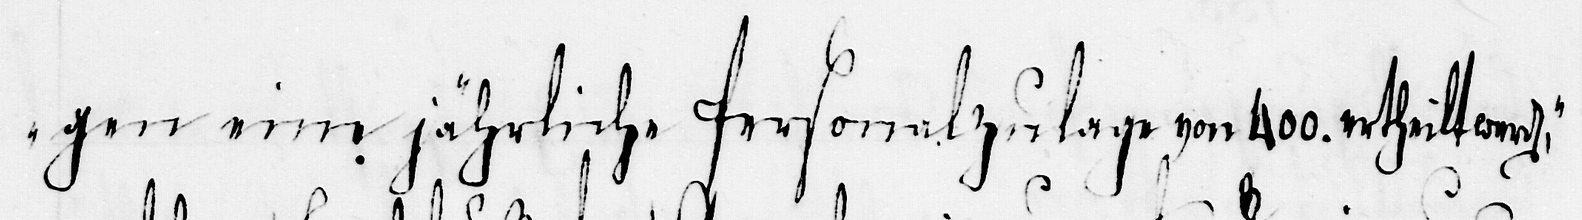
gen eine jährliche Personalzulage von 400. ertheilt
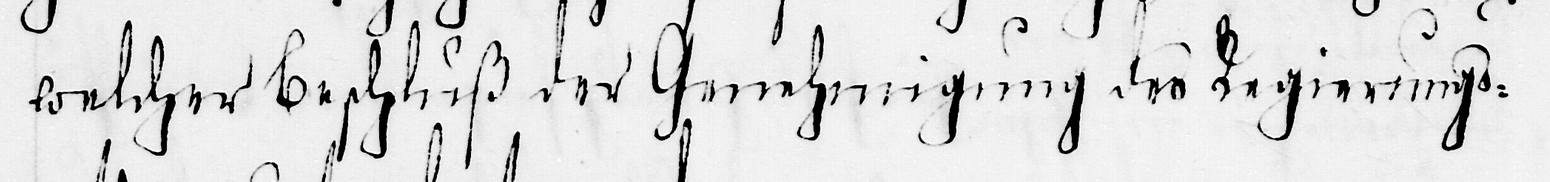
welcher Beschluß der Genehmigung des Regierungs¬
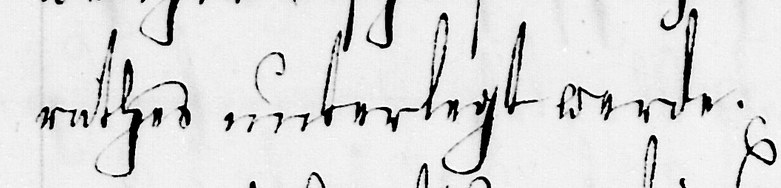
rathes unterlegt werde.
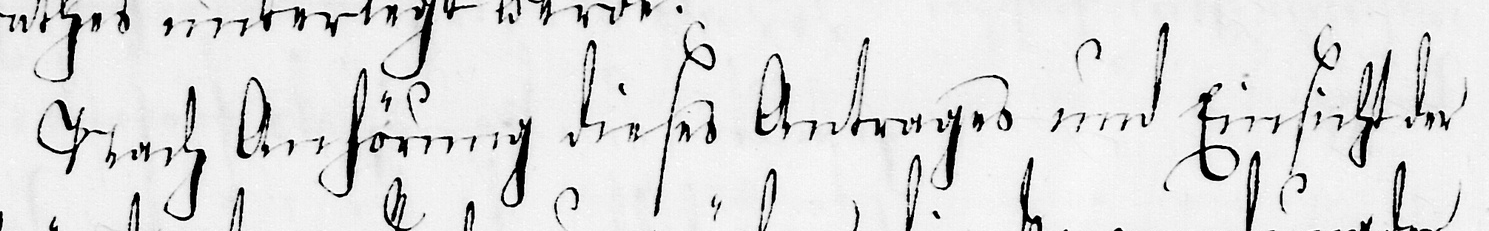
Nach Anhörung dieses Antrages und Einsicht der
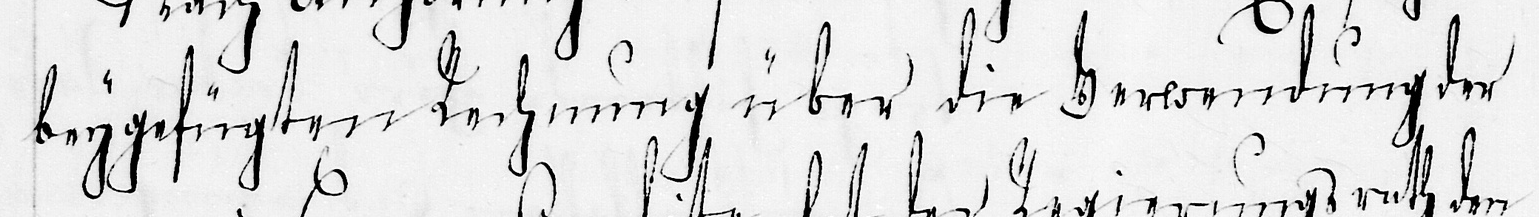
beygefügten Rechnung über die Verwendung der
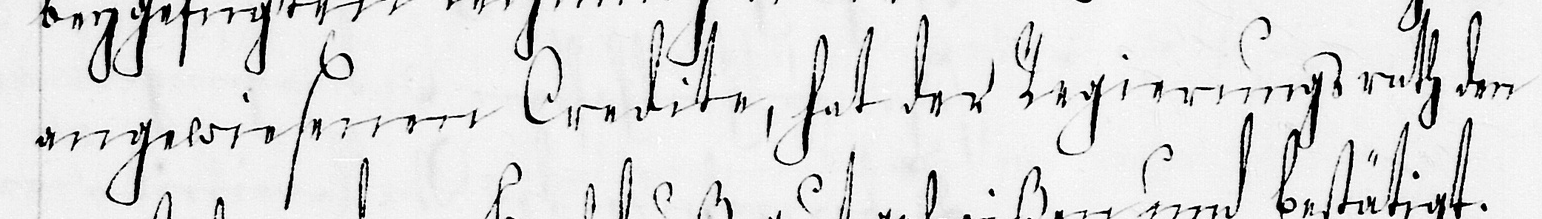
angewiesenen Credite, hat der Regierungsrath den
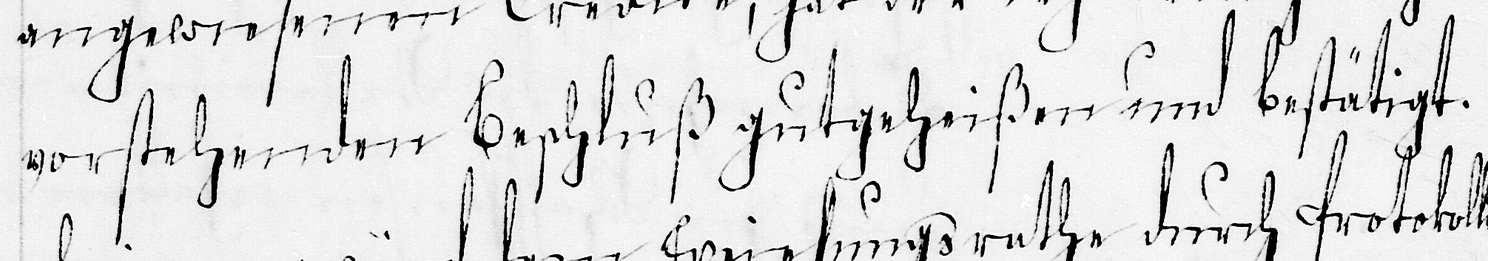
vorstehenden Beschluß gutgeheißen und bestätigt.
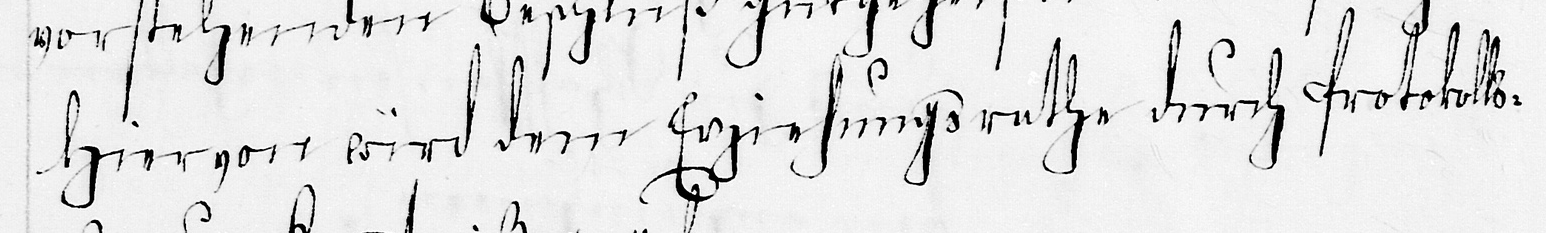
Hiervon wird dem Erziehungsrathe durch Protokoll¬
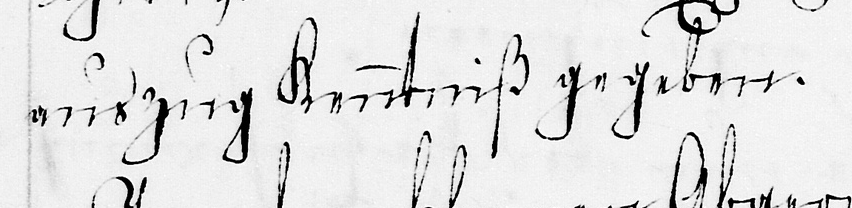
sauszug Kenntniß gegeben.
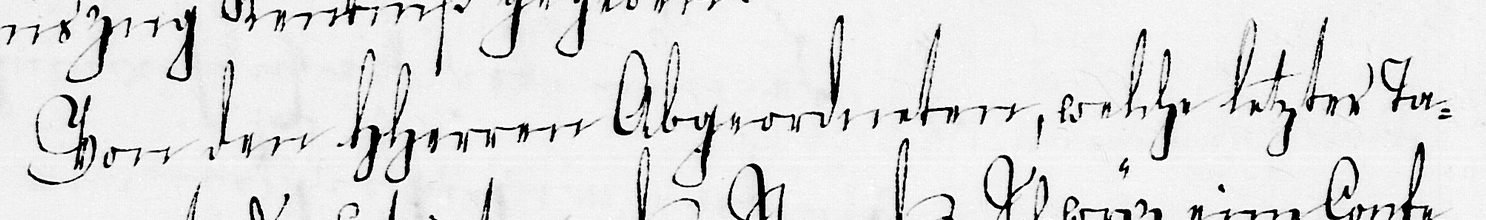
Von den HHerren Abgeordneten, welche letzter Ta¬
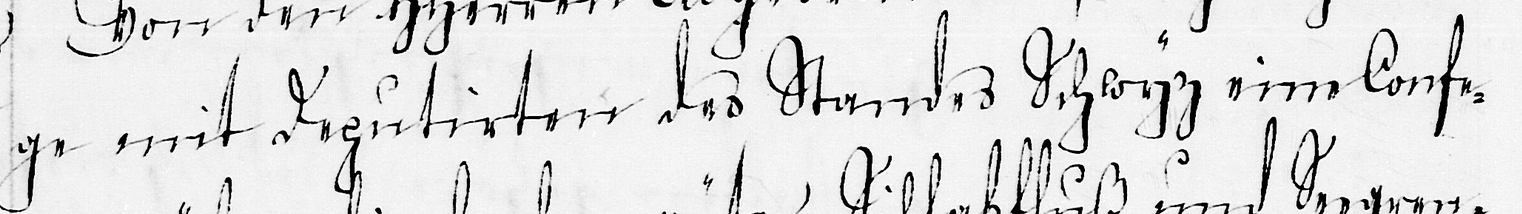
ge mit Deputirten des Standes Schwyz eine Confe¬
